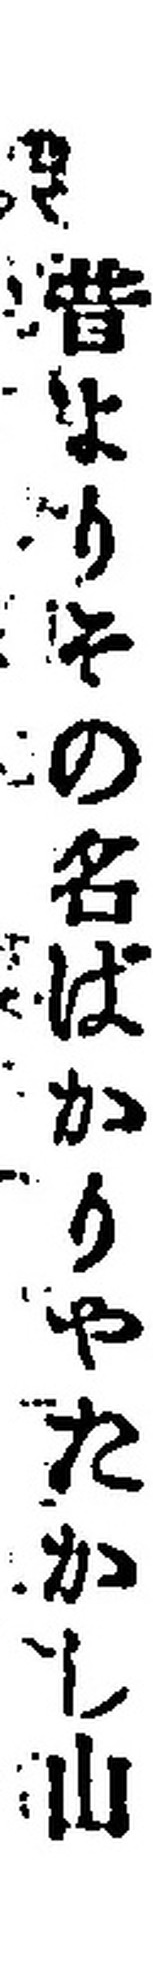昔よりその名ばかりやたかし山
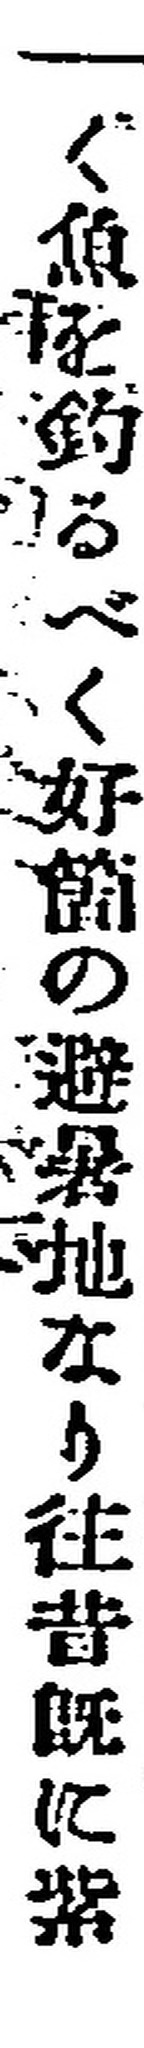く魚を釣るべく好箇の避暑地なり往昔既に紫
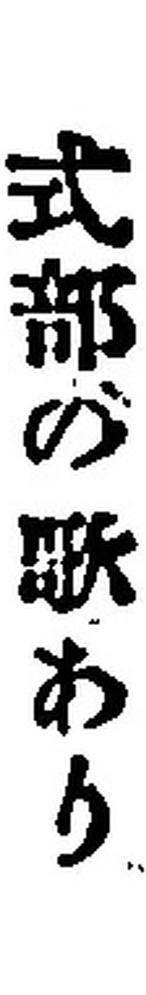式部の歌あり
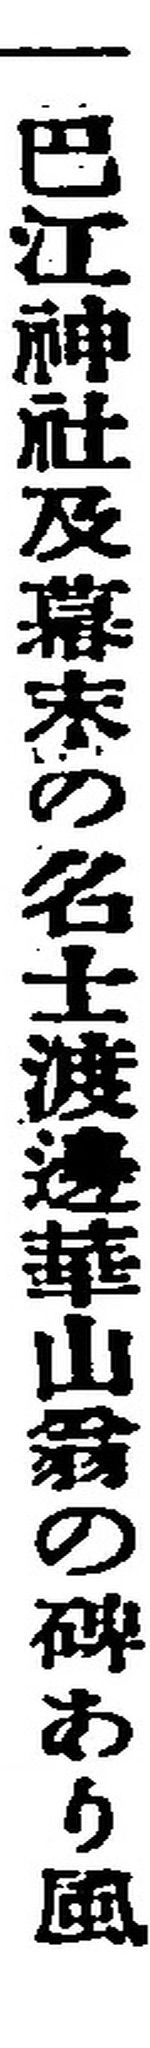巴江神社及幕末の名士渡辺華山翁の碑あり風
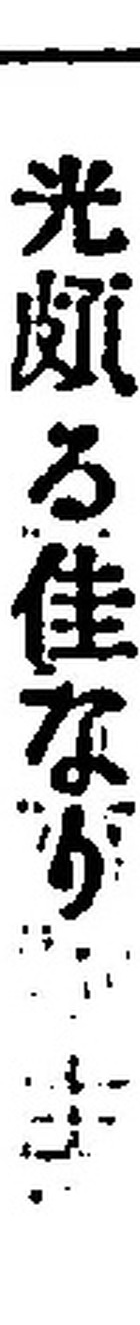光頗る佳なり
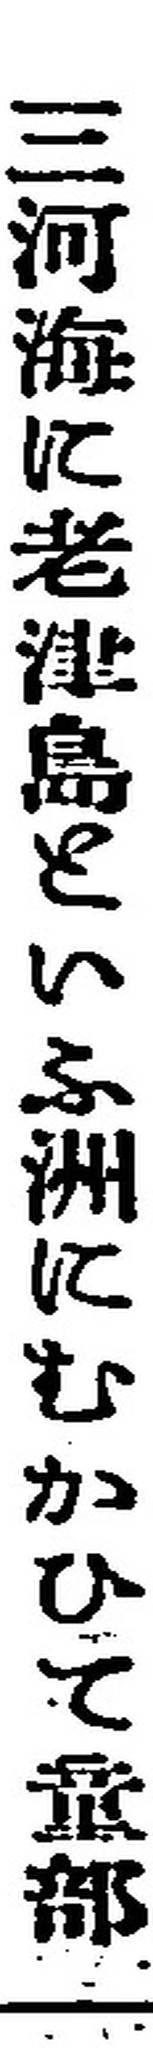三河海に老津島といふ洲にむかひて童部
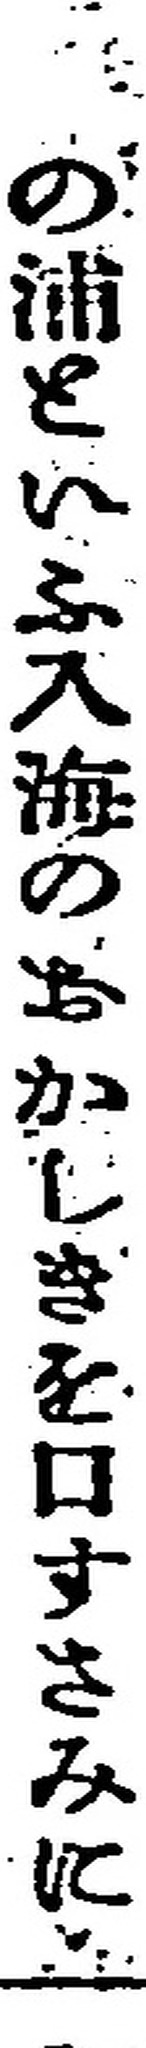の浦といふ入海のおかしきを口すさみに
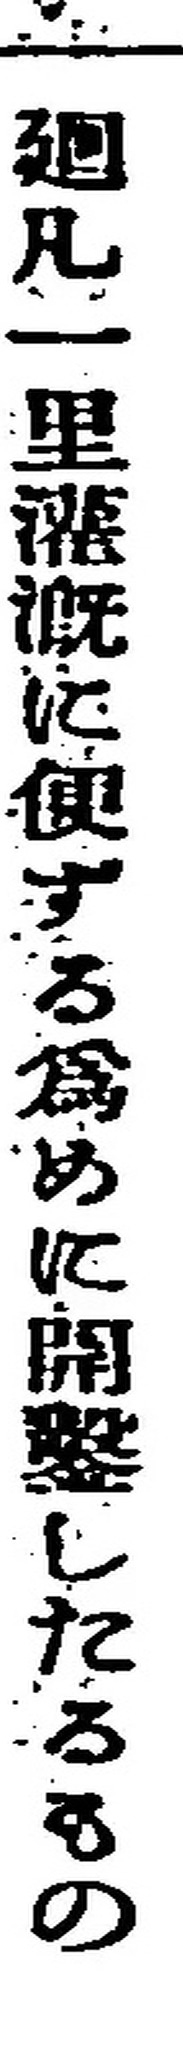廻凡一里灌漑に便ずる為めに開鑿したるもの
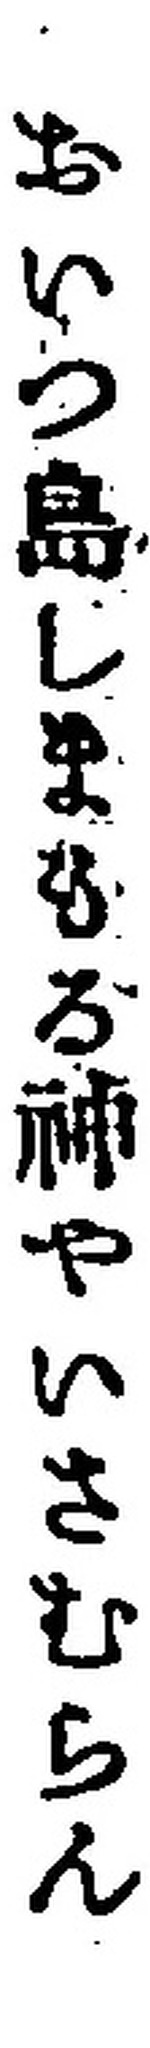おいつ島しまもる神やいさむらん
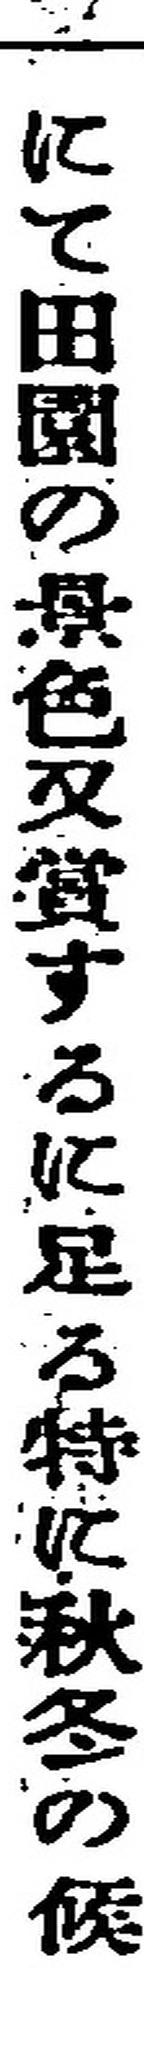にて田園の景色又賞するに足る特に秋冬の候
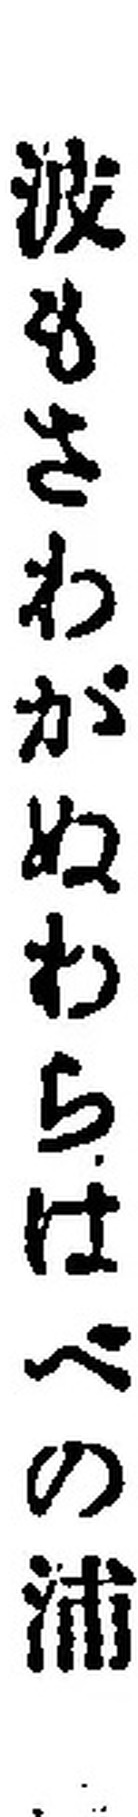波もさわがぬわらはべの浦
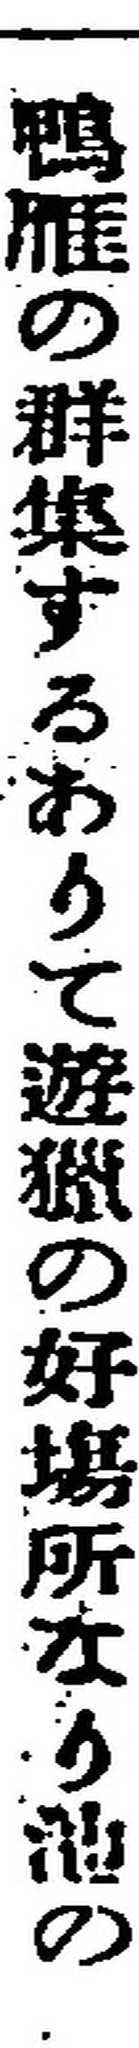鴨雁の群集するありて遊猟の好場所なり池の
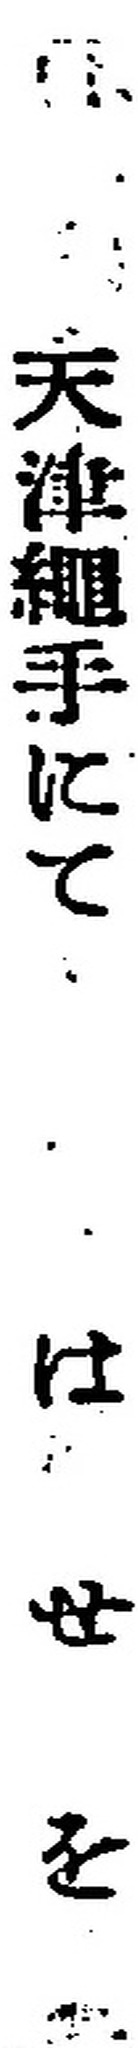天津縄手にてはせを
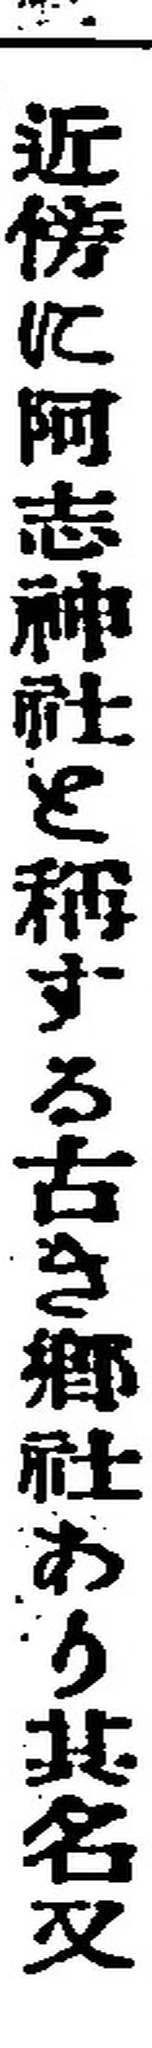近傍に阿志神社と称する古き郷社あり其名又
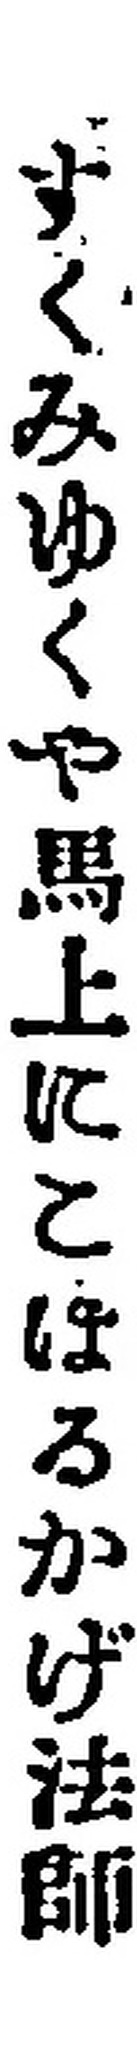すくみゆくや馬上にこほるかげ法師
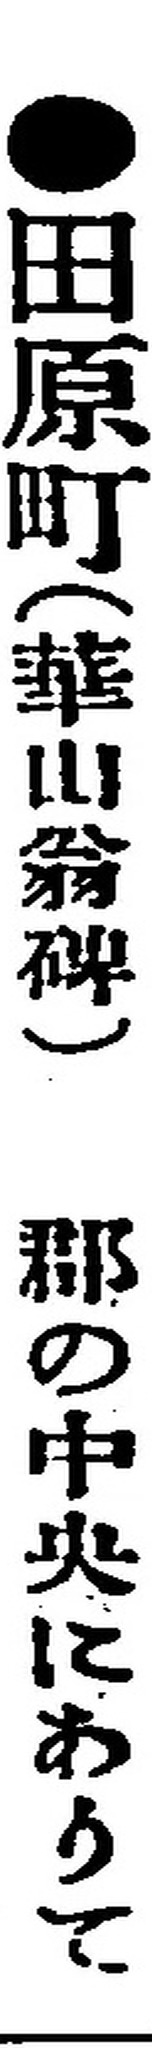●田原町(華山翁碑)郡の中央にありて
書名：東参名勝案内
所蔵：国立国会図書館 National Diet Library, JAPAN
